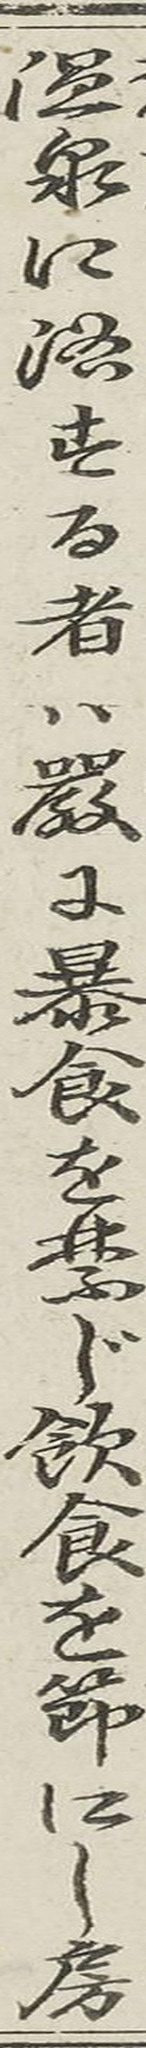温泉に浴者は嚴に暴食を禁じ飲食を節にし房
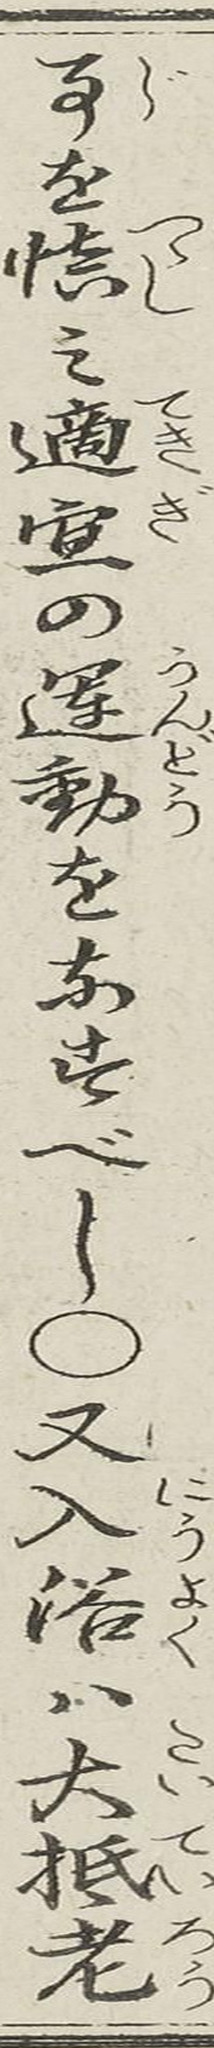事を慎み適宜の運動をなすべし〇また入浴は大抵老
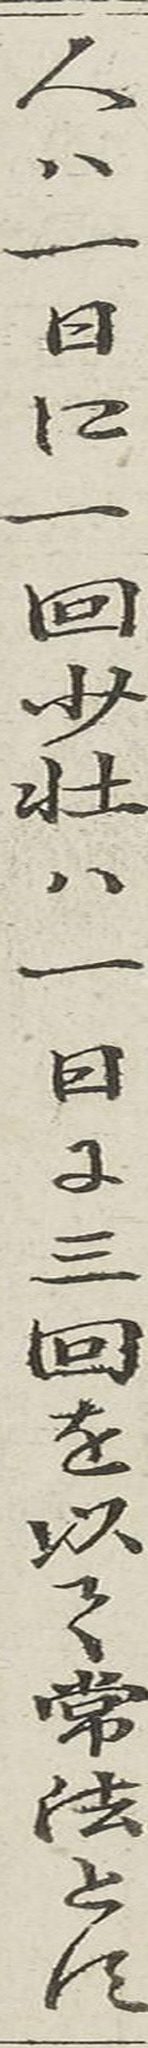人は一日に一回少壮は一日に三回を以て常法とす
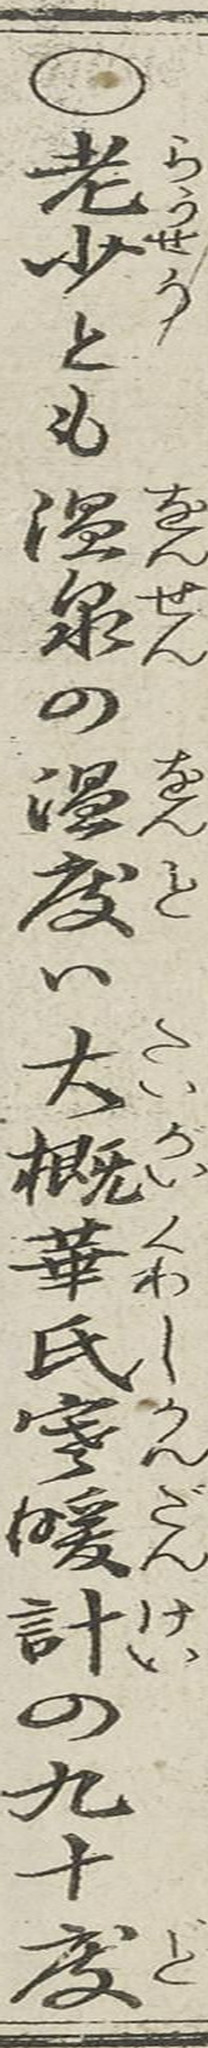〇老少とも温泉の温度は大概華氏寒暖計の九十度
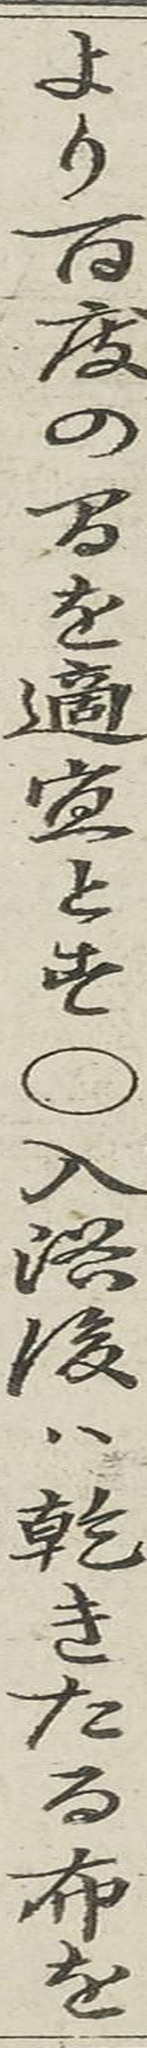より百度の間を適宜とす〇入浴後は乾きたる布を
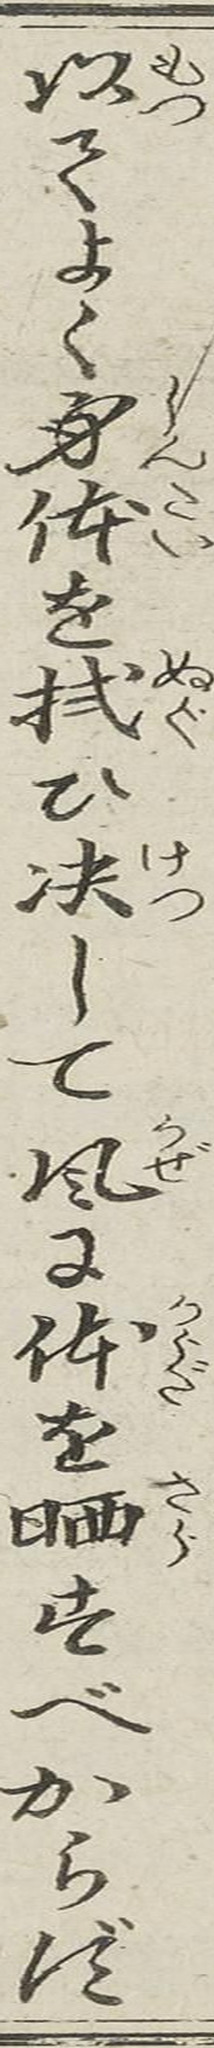以てよく身体を拭ひ決して風に晒すべからず
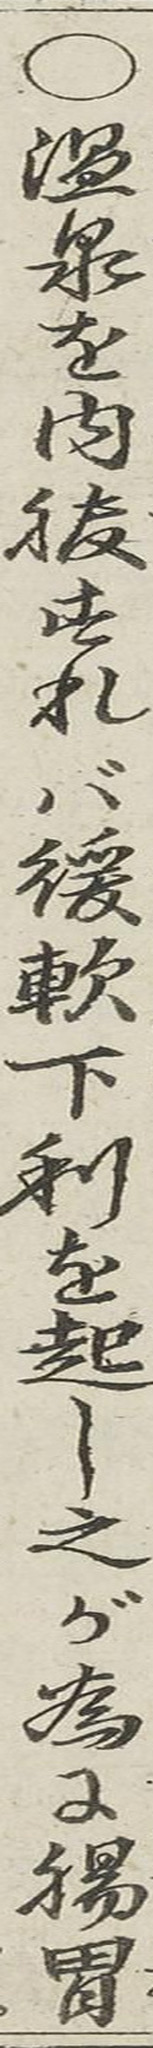〇温泉を内服すれば緩軟下利を起し之が為に腸胃
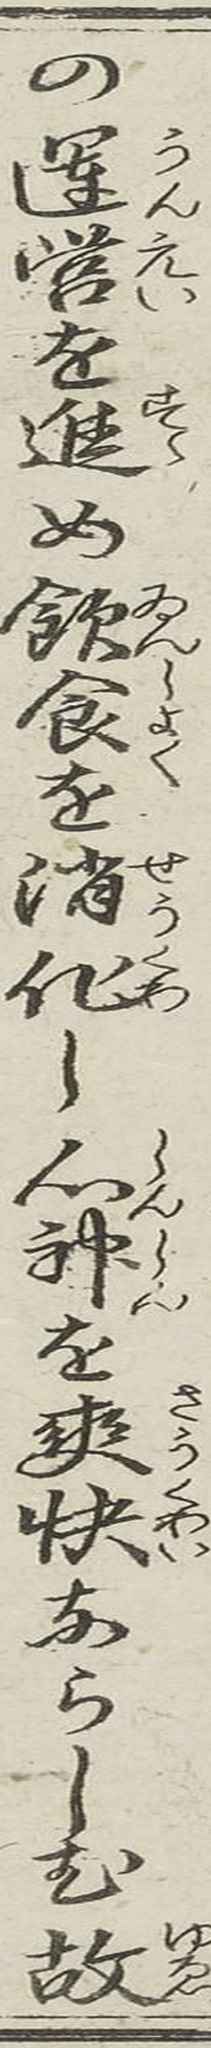の運営を進め飲食を消化し人神を爽快ならしむ故
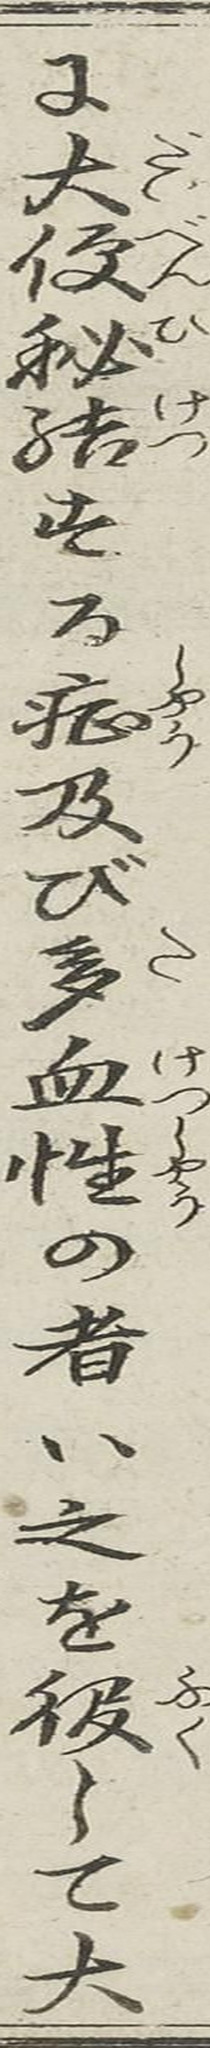に大便秘結する症及び多血性の者は之を服して大
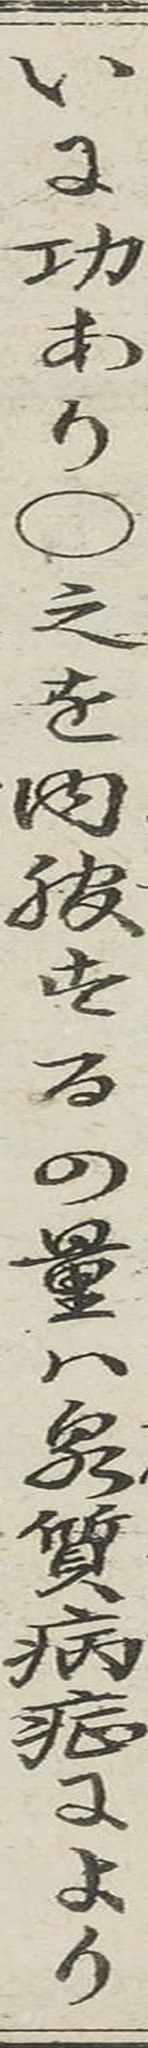いに功あり〇之を内服するの量は泉質病症により
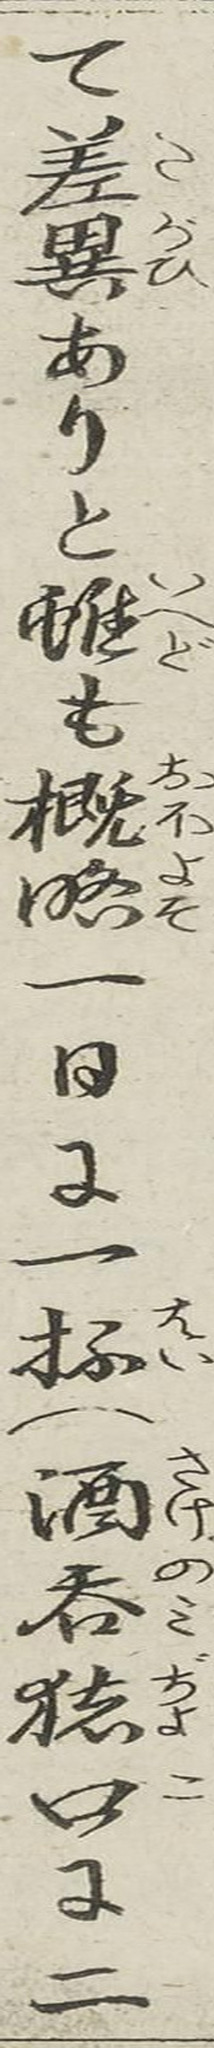て差異ありと雖も概略一日に一杯猪口に二
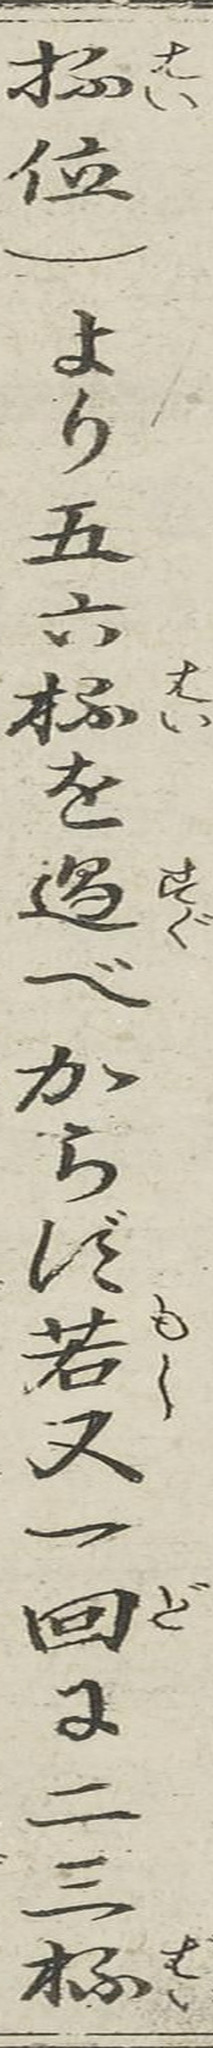杯位）より五六杯を過べからず若又一回に二三杯
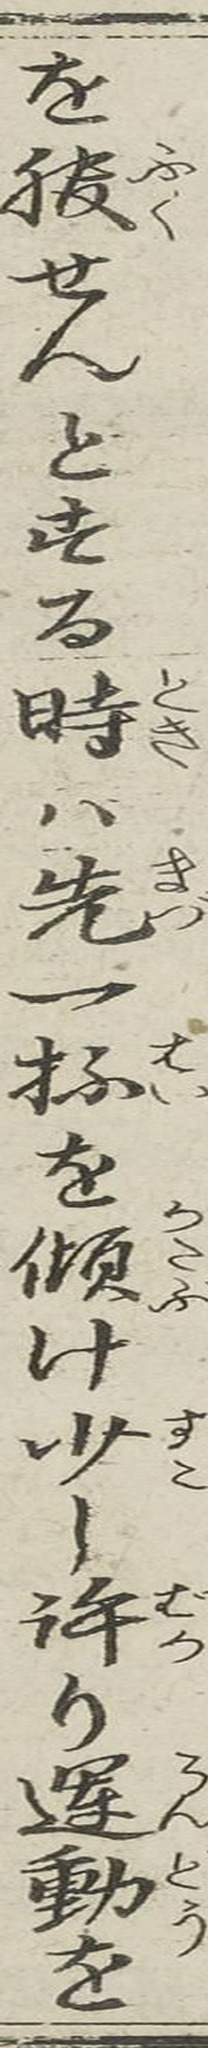を服せんとする時は先一杯を傾け少し許り運動を

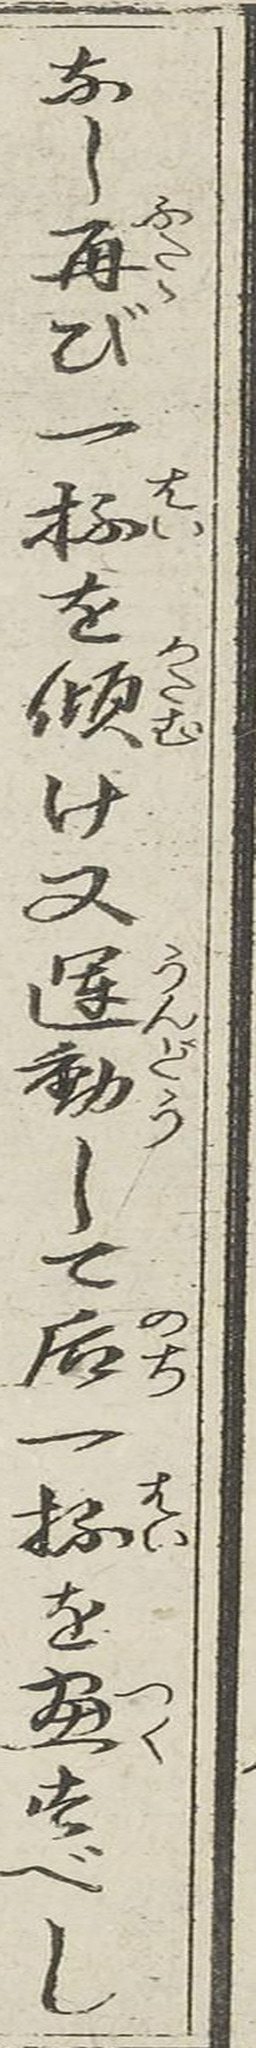なし再び一杯を傾け又運動して后一杯を尽すべし
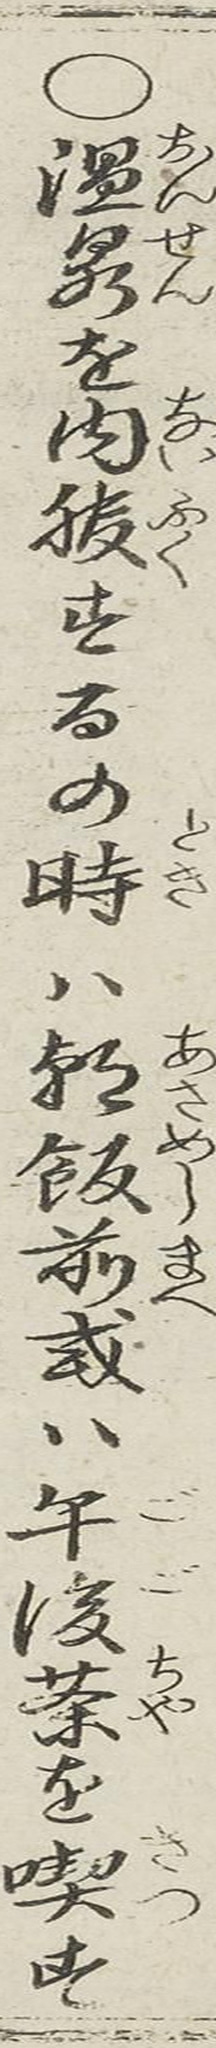○温泉を内服するの時は朝飯前或は午後茶を喫す
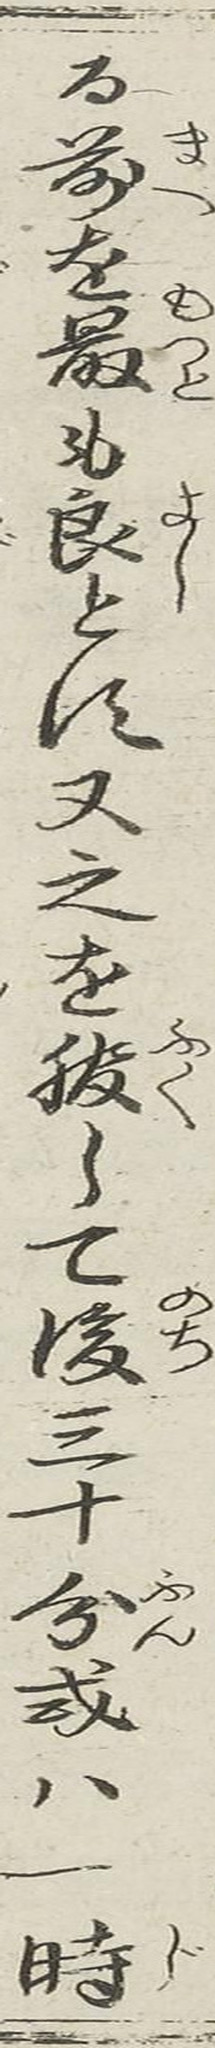る前を最も良とす又之を服して後三十分或は一時
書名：箱根温泉誌　全
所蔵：東京大学地震研究所図書室 Earthquake Research Institute Library, The University of Tokyo, JAPAN
